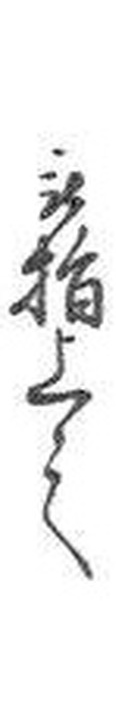被指上之
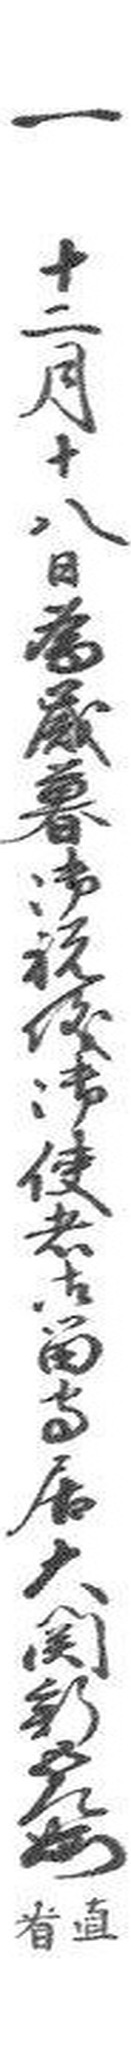一十二月十八日為歳暮御祝儀御使者御留守居大関新五左衛門直看
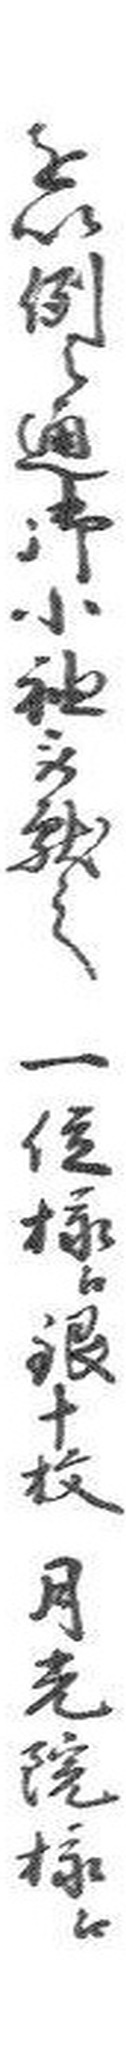を以例之通御小袖被献之一位様江銀十枚月光院様江
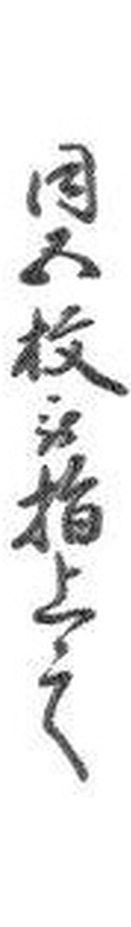同五枚被指上之
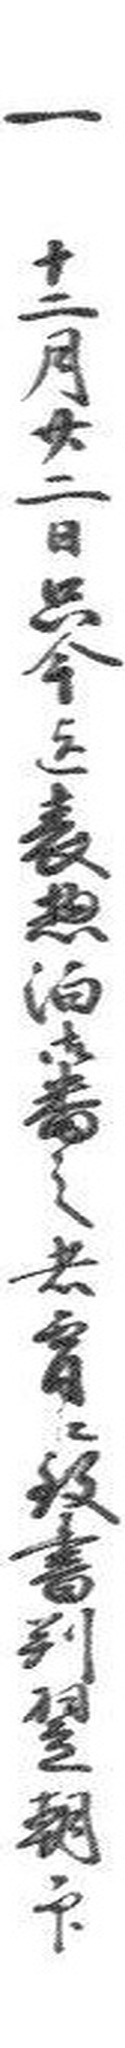一十二月廿二日只今迄表惣泊御番之者宵ニ致書判翌朝印
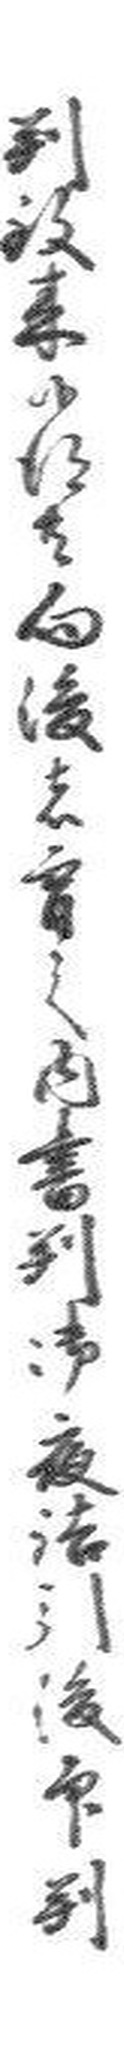判致来候得共向後者宵之内書判御夜詰引後印判
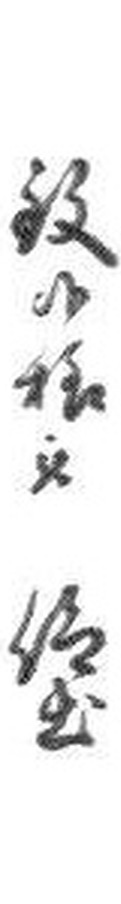致候様被仰出
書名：家譜 二十九 吉邦公 従正徳二年到正徳三年
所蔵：福井県文書館 Fukui Prefectural Archives
